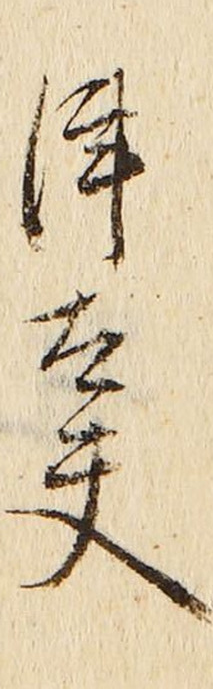津太夫
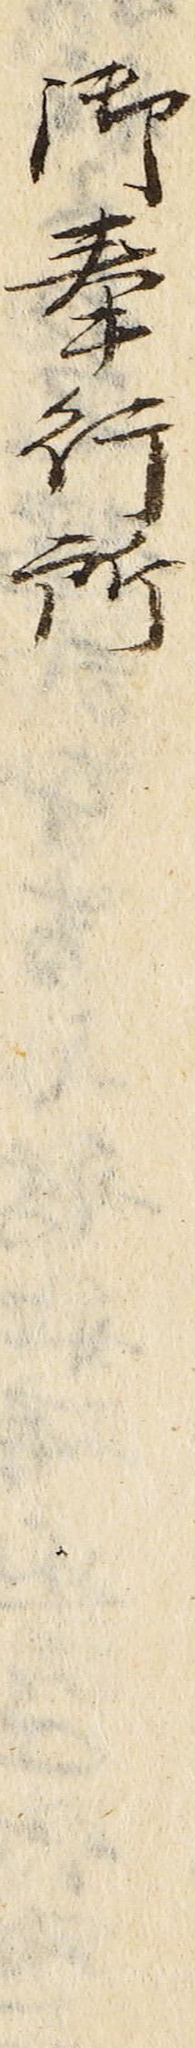御奉行所
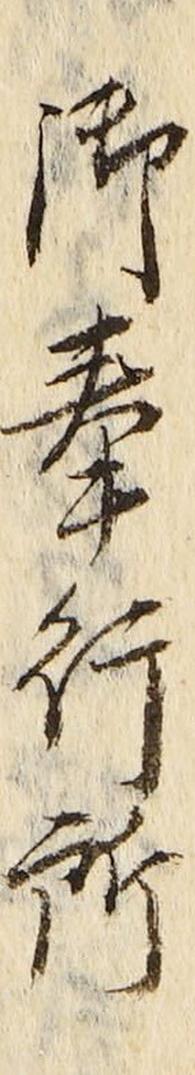御奉行所
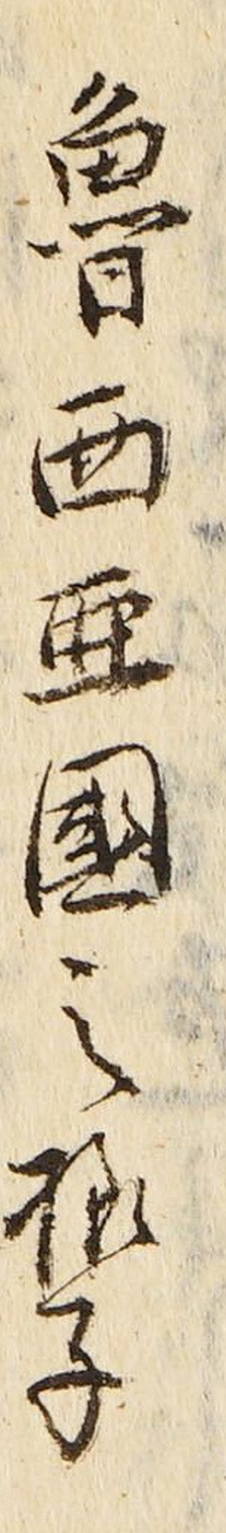魯西亜国之様子
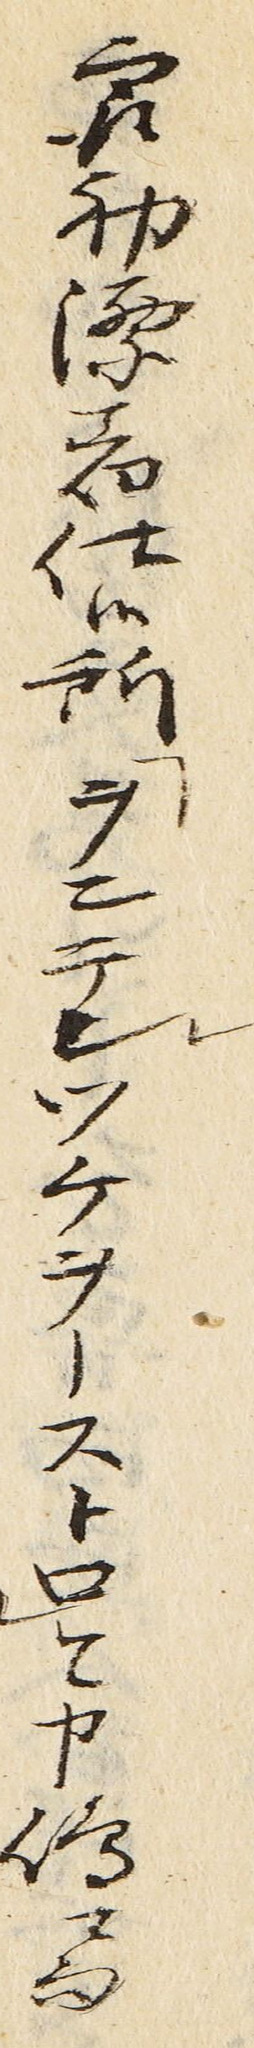最初漂着仕候所「ヲンテレツケヲーストロ」と申島に而
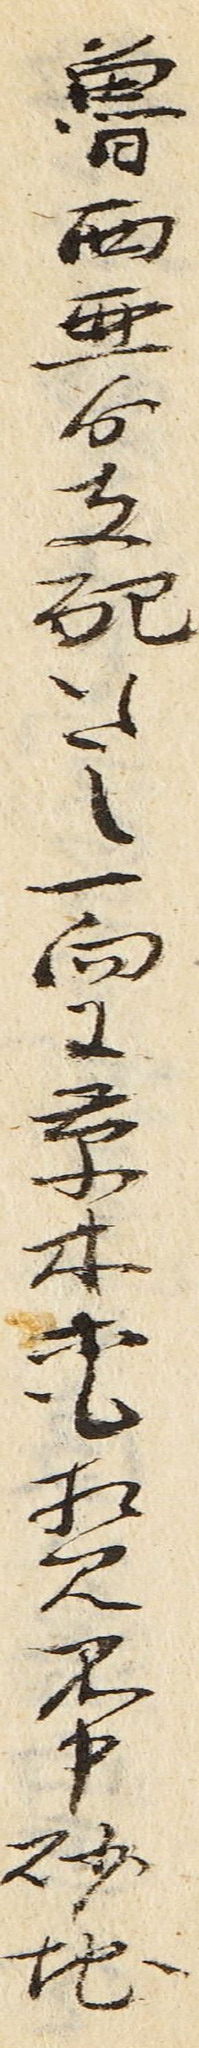魯西亜ゟ支配いたし一向に草木等も相見不申砂地
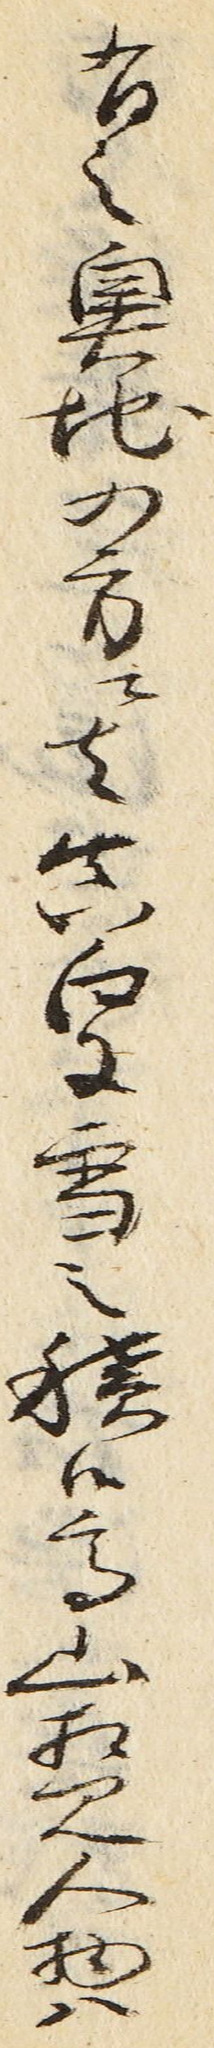有之奥地の方には真白に雪之積候高山相見人物は
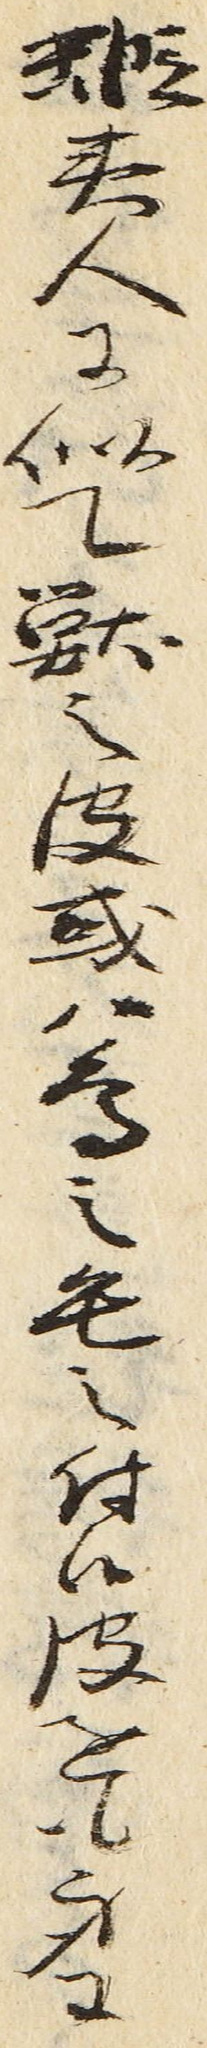蝦夷人に似て獣之皮或は鳥之毛之付候皮をも身に
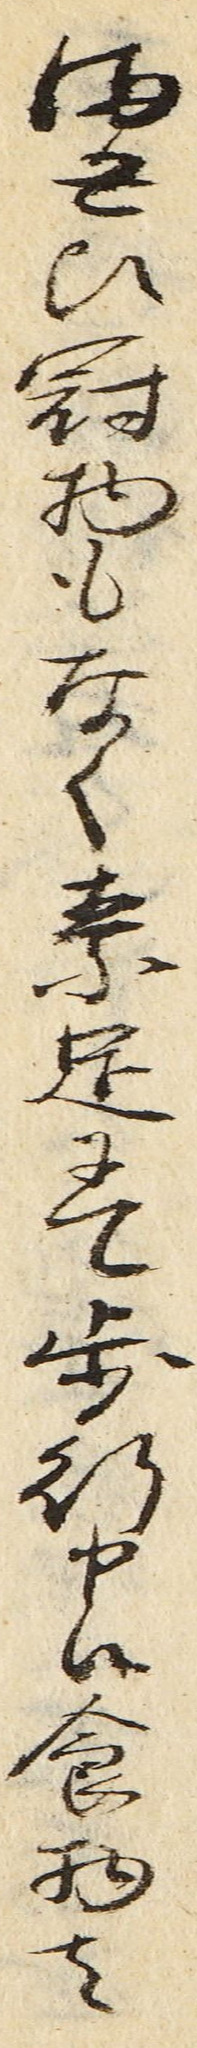まとひ冠物もなく素足にて歩行申候食物は
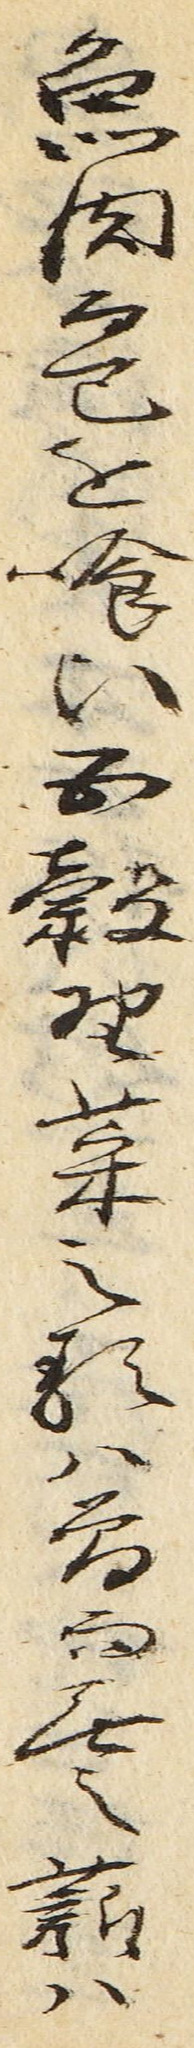魚肉而已を喰ひ五穀野菜之類は曽而無之薪は

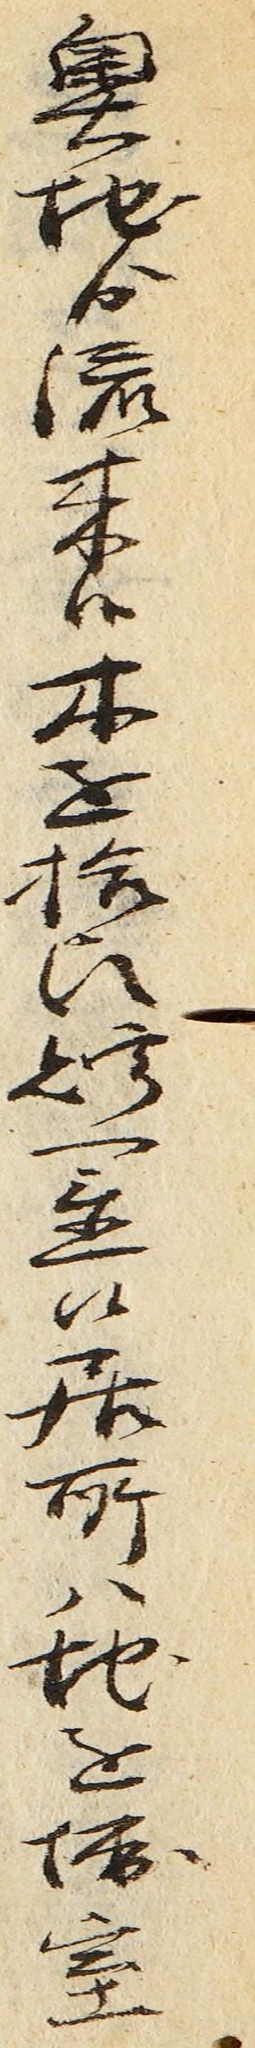奥地ゟ流来候木を拾ひ貯置候居所は地を堀室
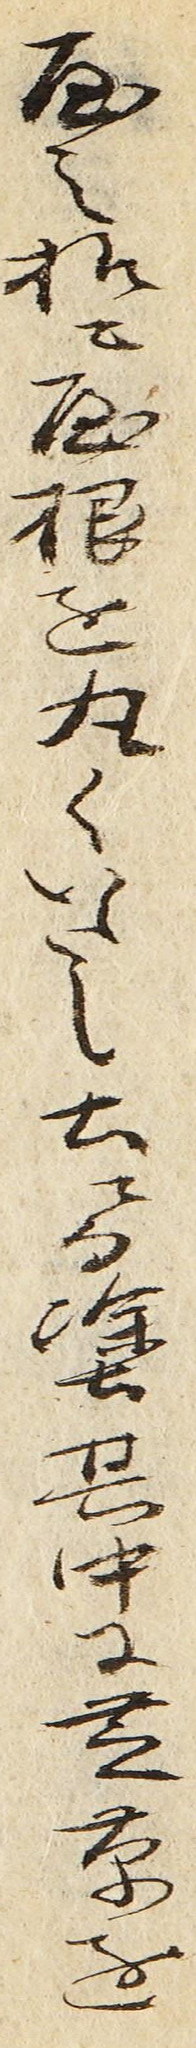屋之様に屋根を丸くいたし土にて塗其中に芝草を
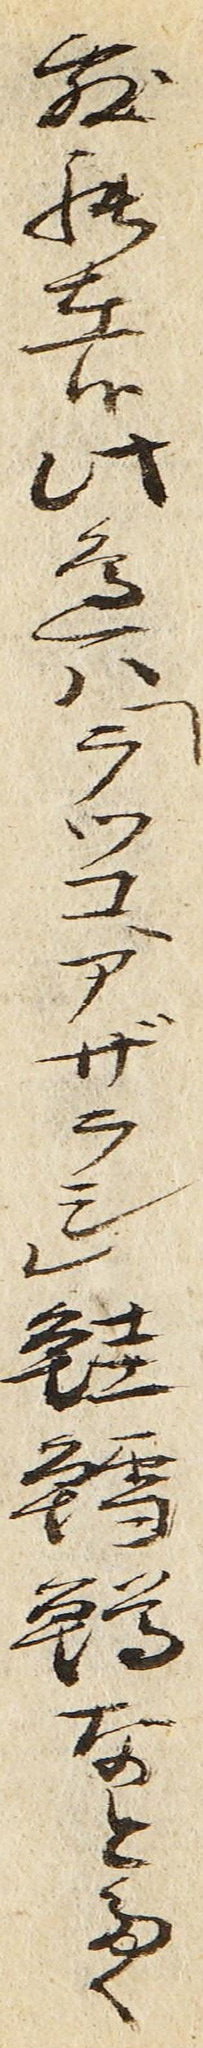敷罷在候此辺は「ラツコ、アザラシ」鮭鱈鱒なと多く
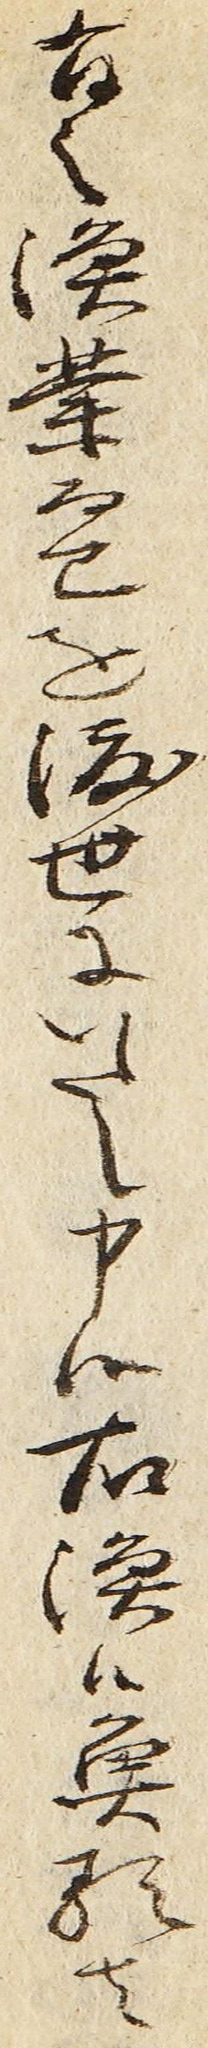有之漁業而已を渡世にいたし申候右漁候魚類は
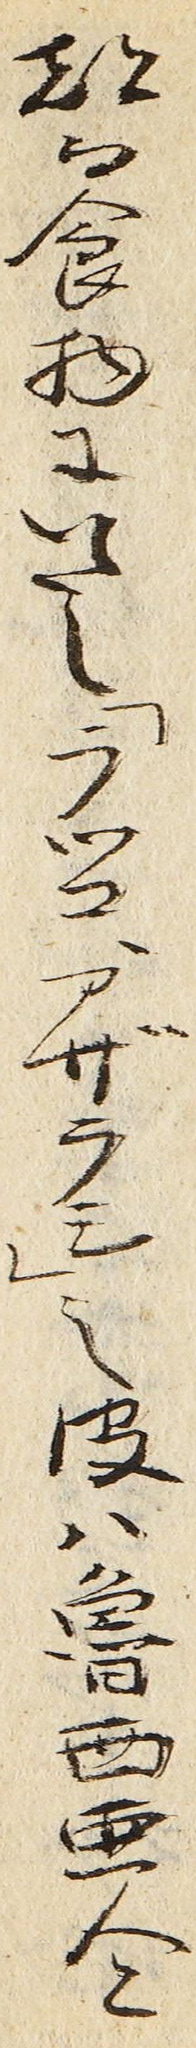都て食物にいたし「ラツコ、アザラシ」之皮は魯西亜人と
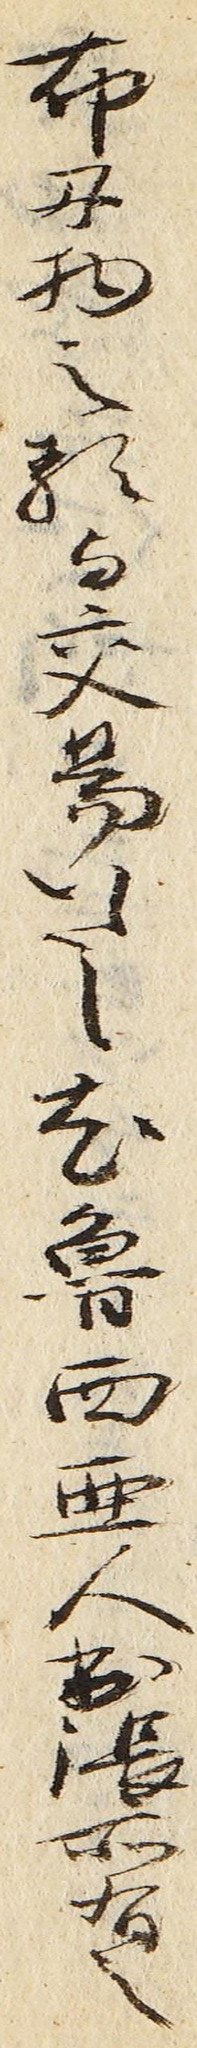布刃物之類と交易いたし尤魯西亜人出張所有之
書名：漂民後記
